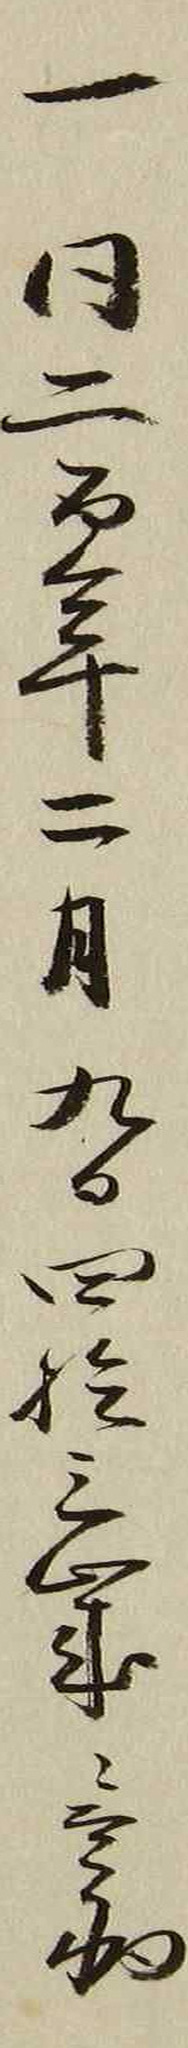一同二酉年二月九日四拾三歳ニ而病
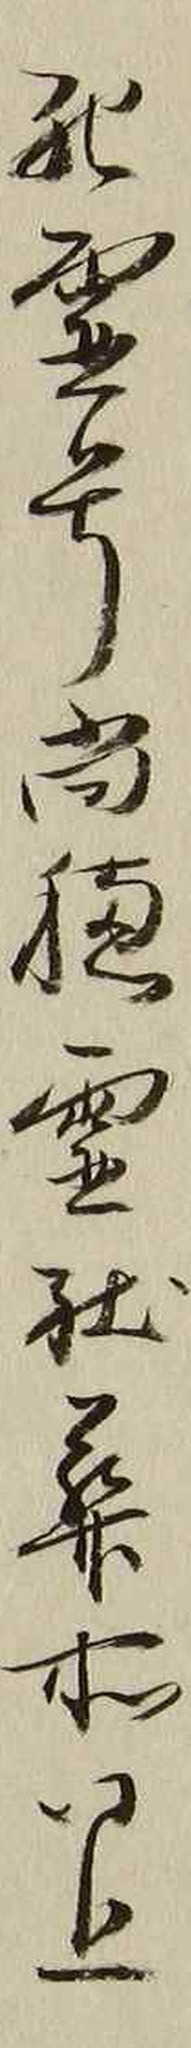死霊号尚穂霊社葬所同上
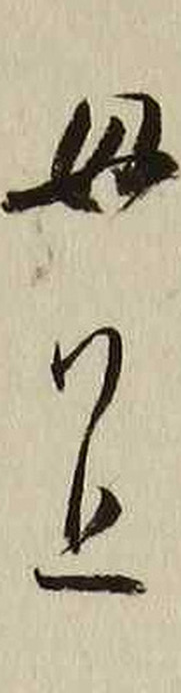母同上
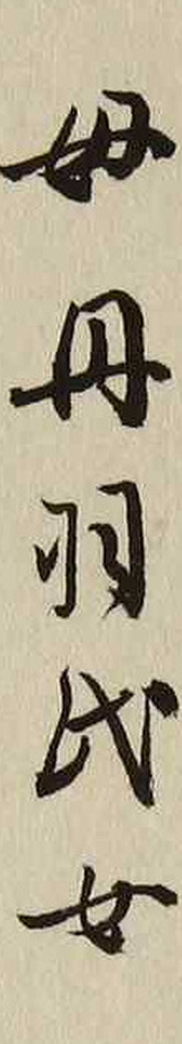母丹羽代女
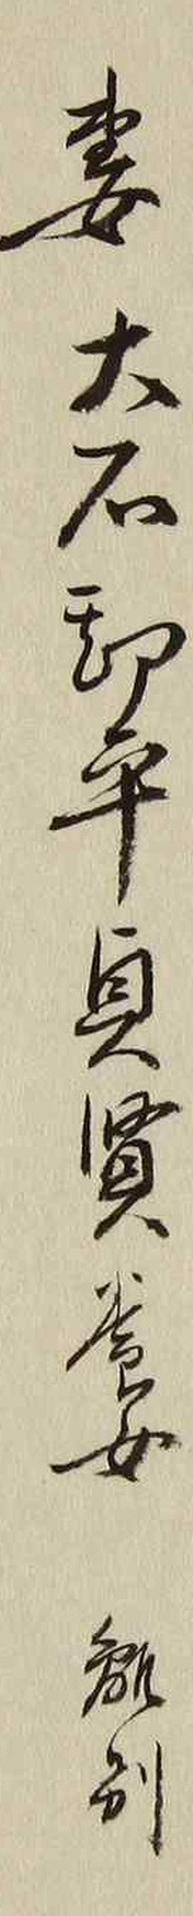妻大石勘平貞賢養女離別
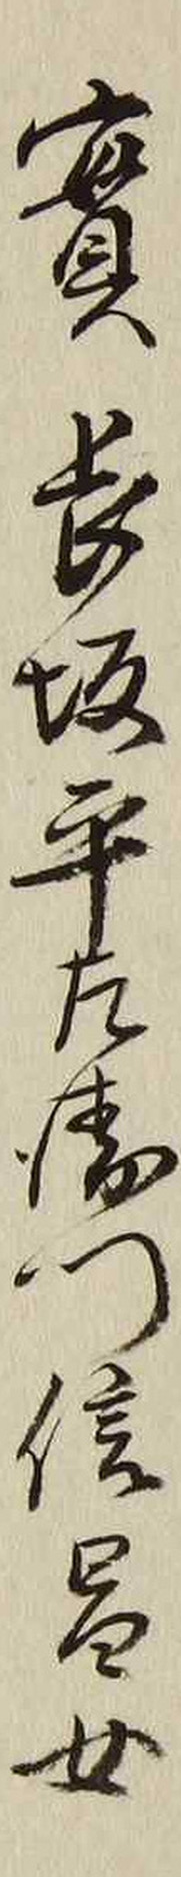実長坂平左衛門信昌女
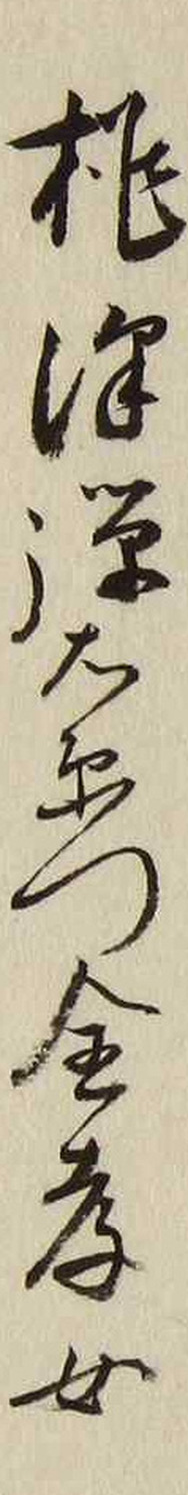桃沢弾右衛門全孝女

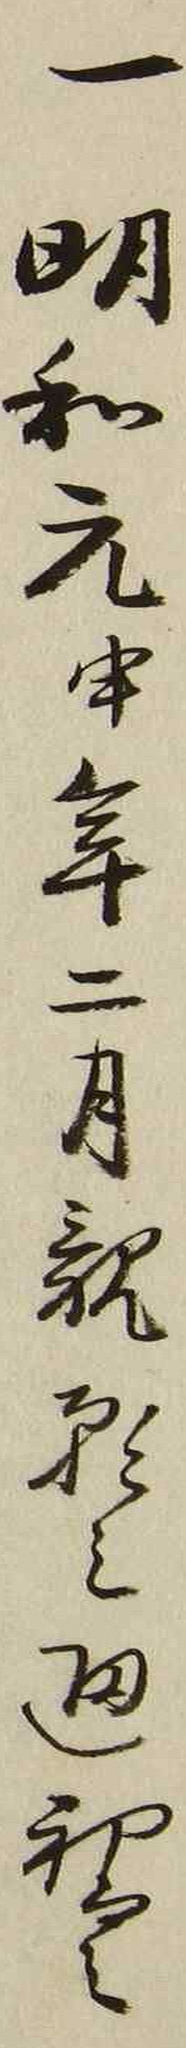一明和元申年二月親願之通初而之
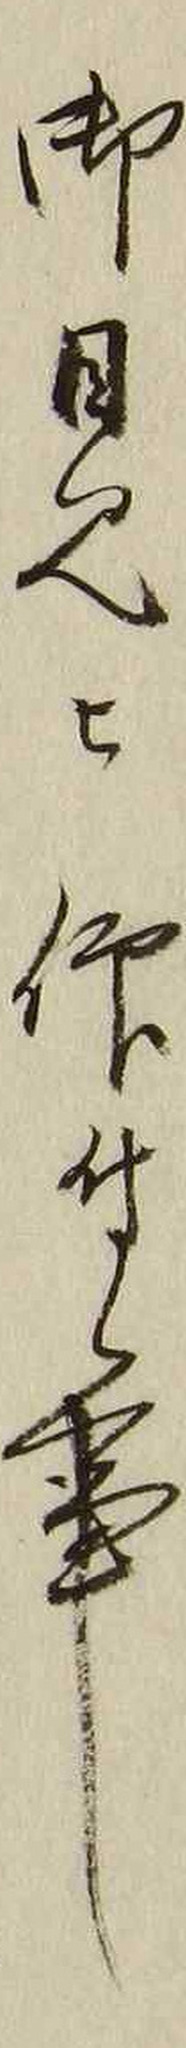御目見被仰付候事
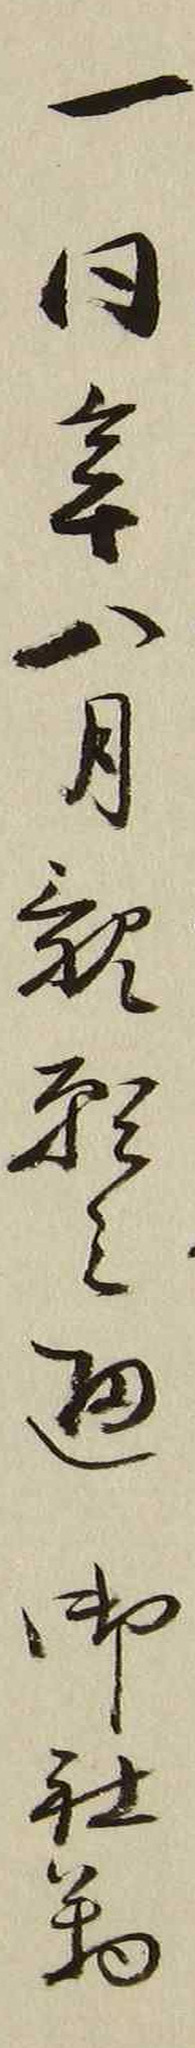一同年八月親願之通御社勤
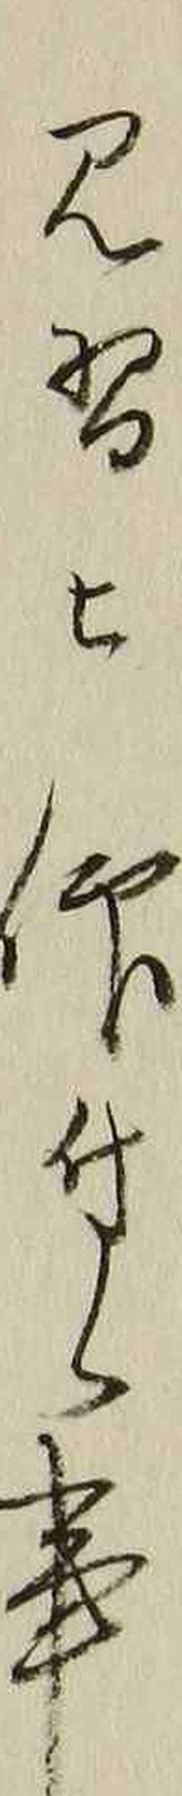見習被仰付候事
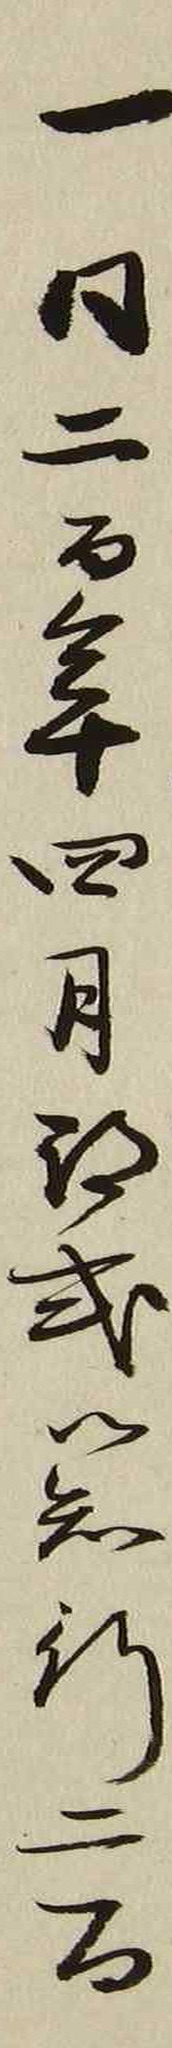一同二酉年四月跡式御知行二百
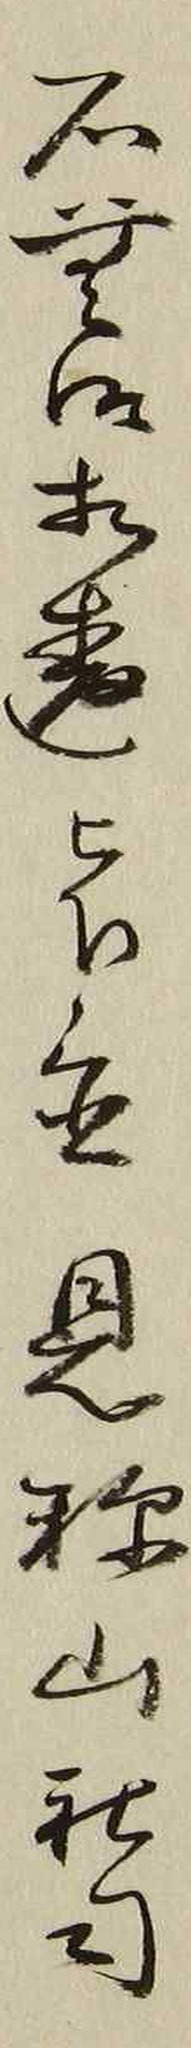石無御相違被下置見称山社司
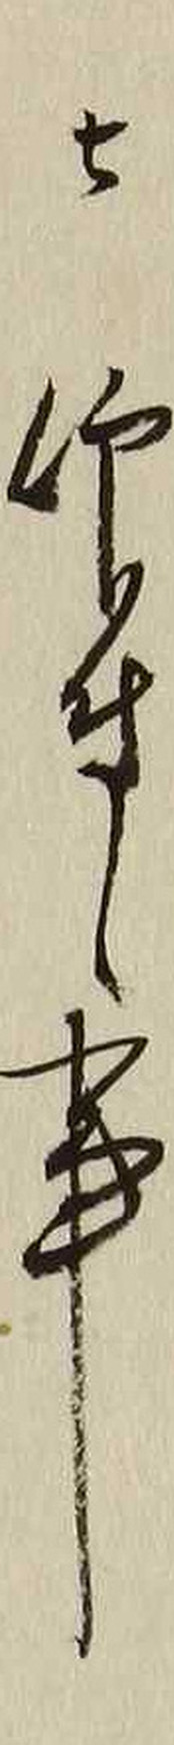被仰付候事
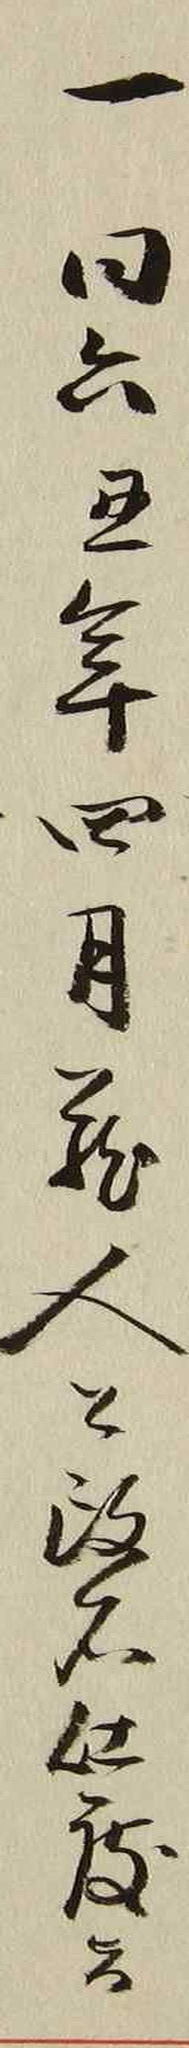一同六丑年四月蔵人と改名仕度旨
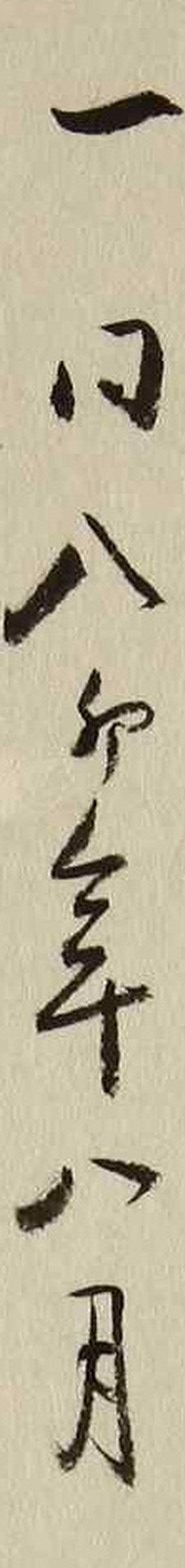一同八卯年八月
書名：諸士系譜　巻之291　さ之部23
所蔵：会津若松市立会津図書館
